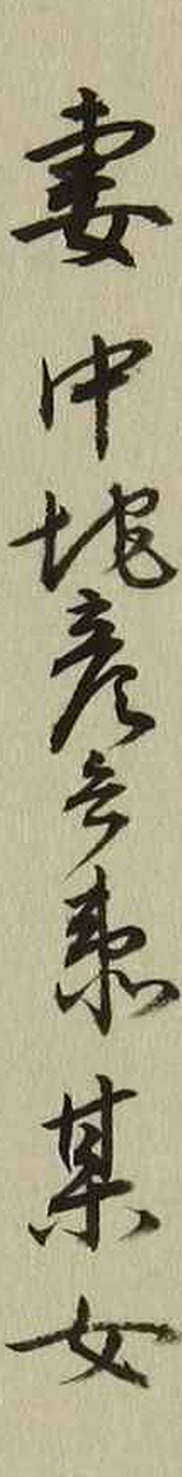妻中地彦兵衛某女
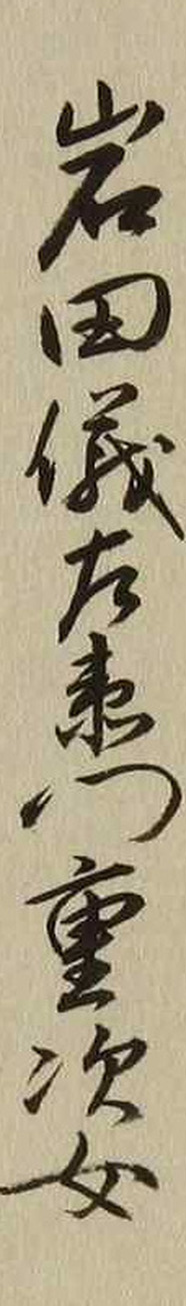岩田儀左衛門重次女
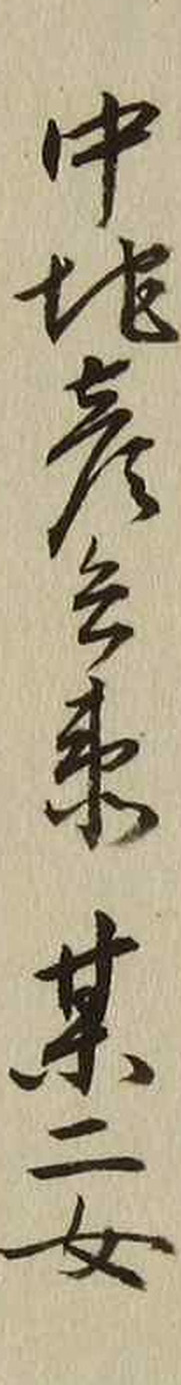中地彦兵衛某二女
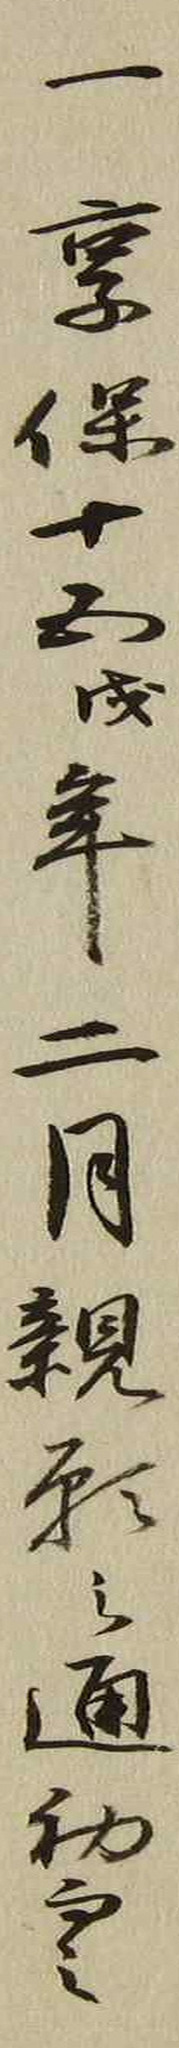一享保十五戌年二月親願之通初而之
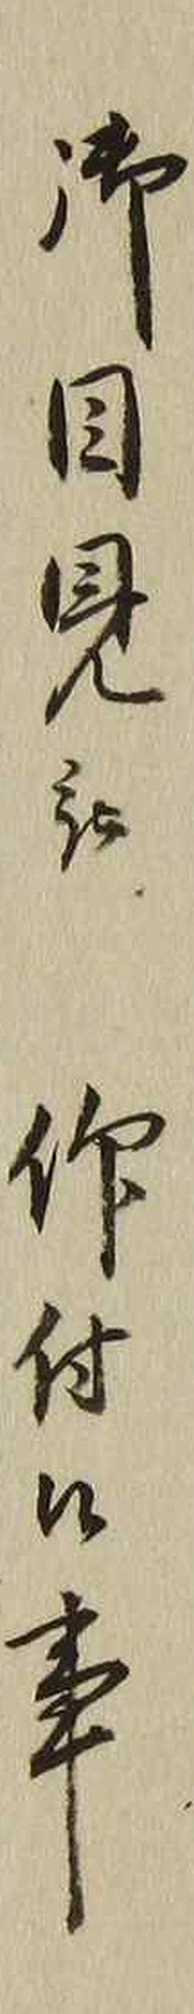御目見被仰付候事
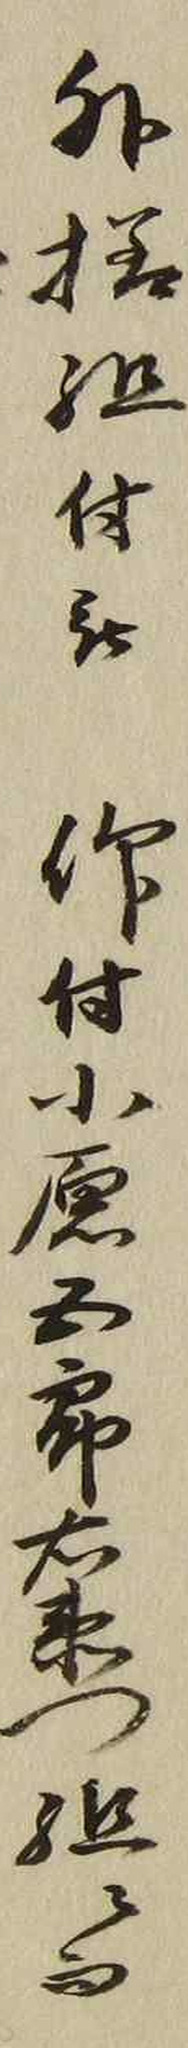外様組付被仰付小原五郎右衛門組ニ而
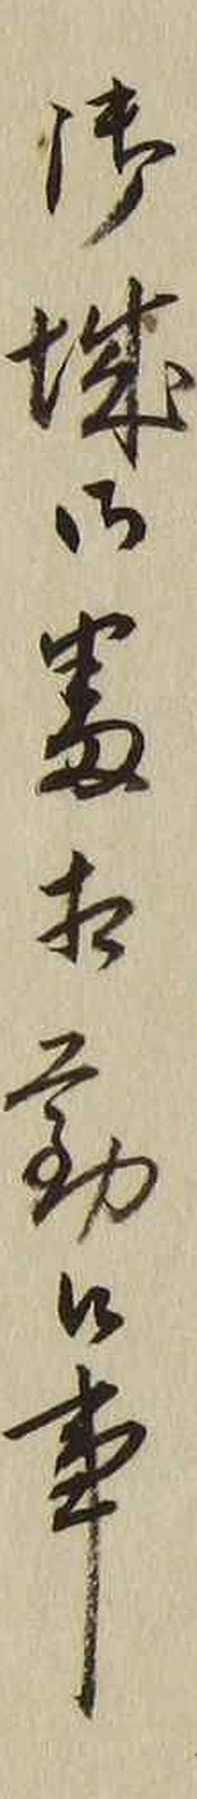御城御番相勤候事
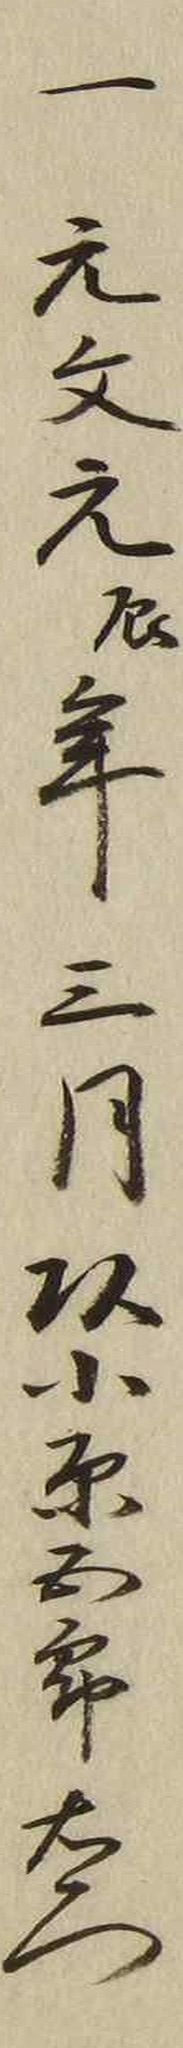一元文元辰年三月頭小原五郎右衛門

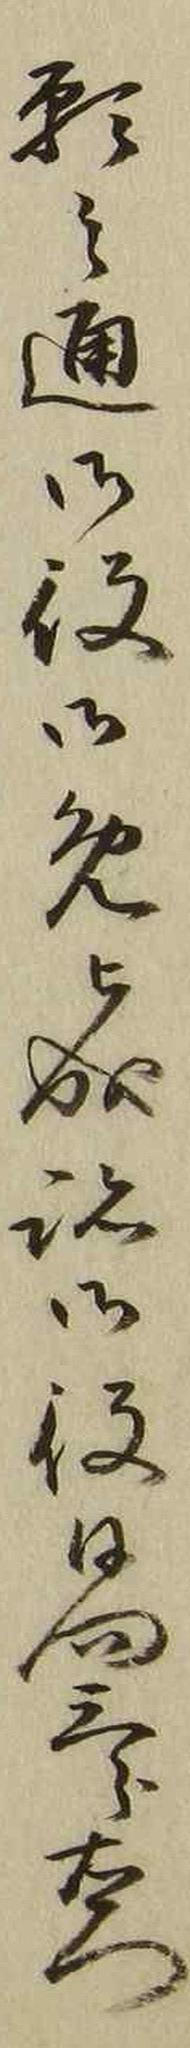願之通御役御免被成跡御役日向三郎右衛門
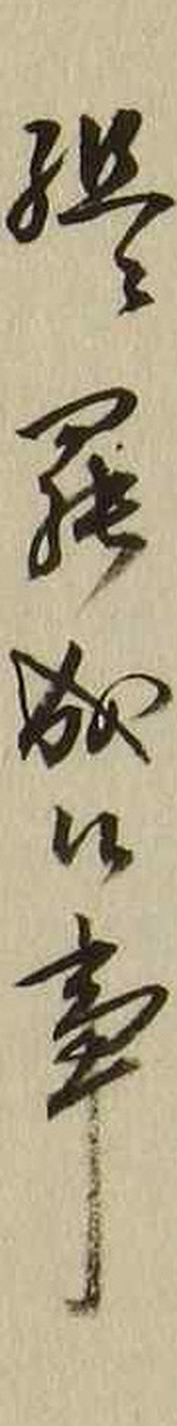組ニ罷成候事
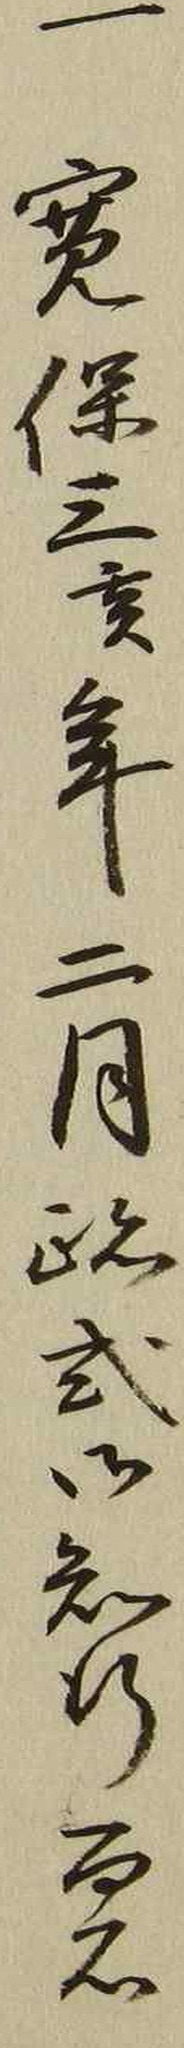一寛保三亥年二月跡式御知行百石
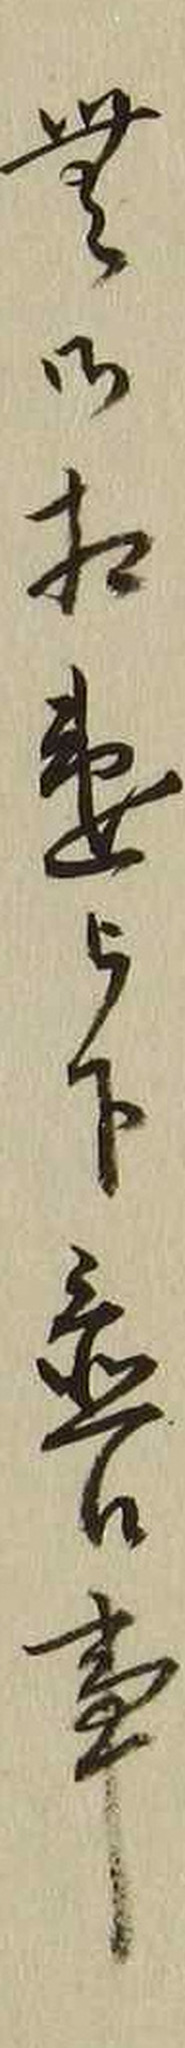無御相違被下置候事
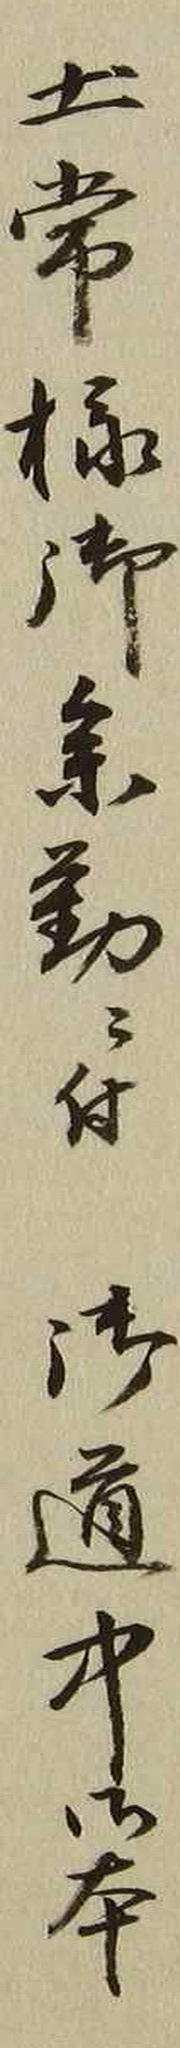土常様御参勤ニ付御道中御本
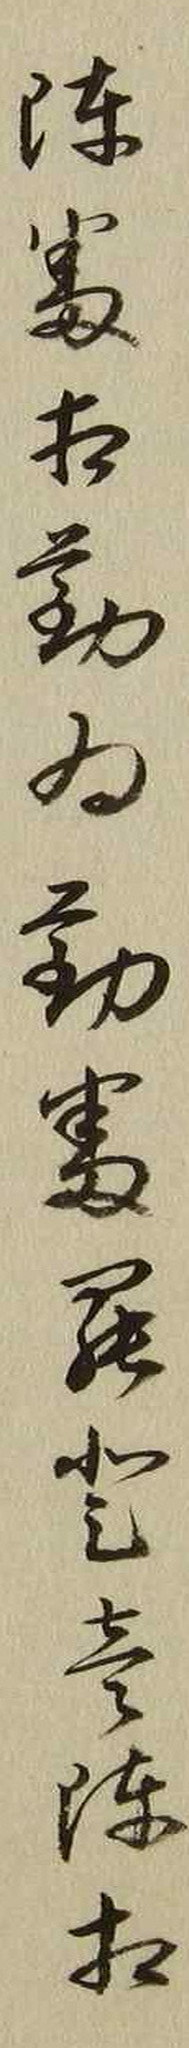陣番相勤為勤番罷登壱陣相
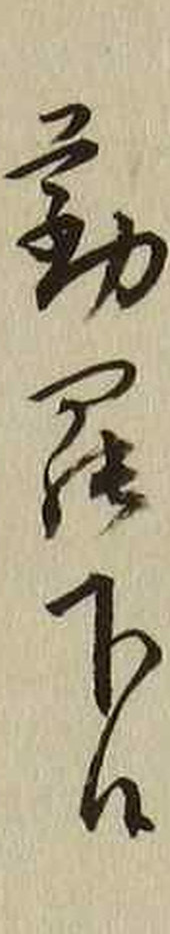勤罷下候
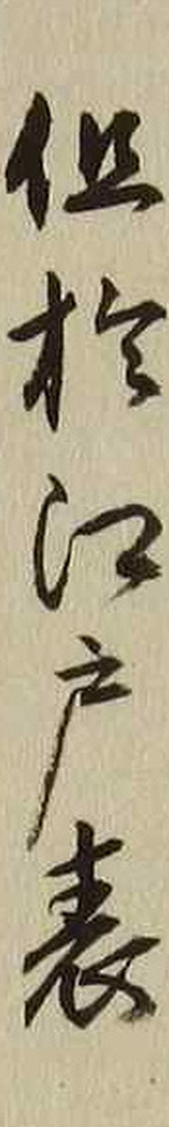但於江戸表
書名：諸士系譜　巻之128　た之部4
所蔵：会津若松市立会津図書館
